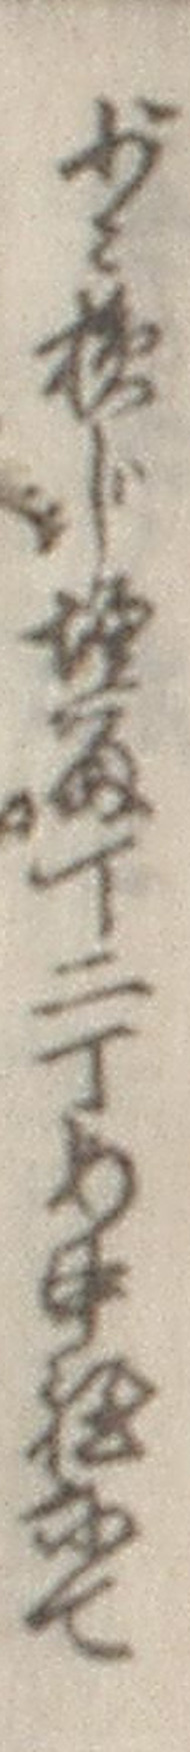少〻損じ堀留丁二丁め中程にて
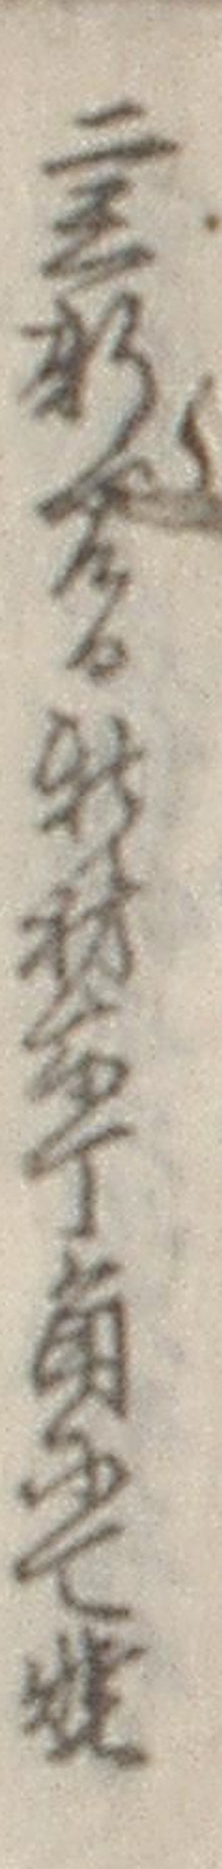二三軒やける新材木丁角にて焼
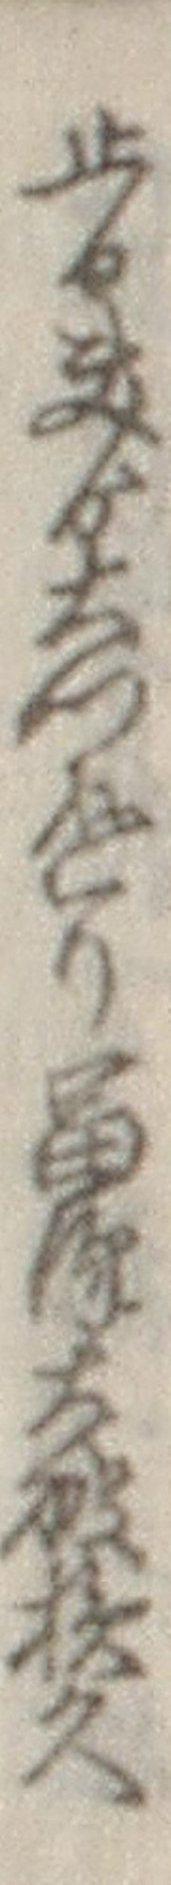止る夫ゟ大川通り冨澤大破損久
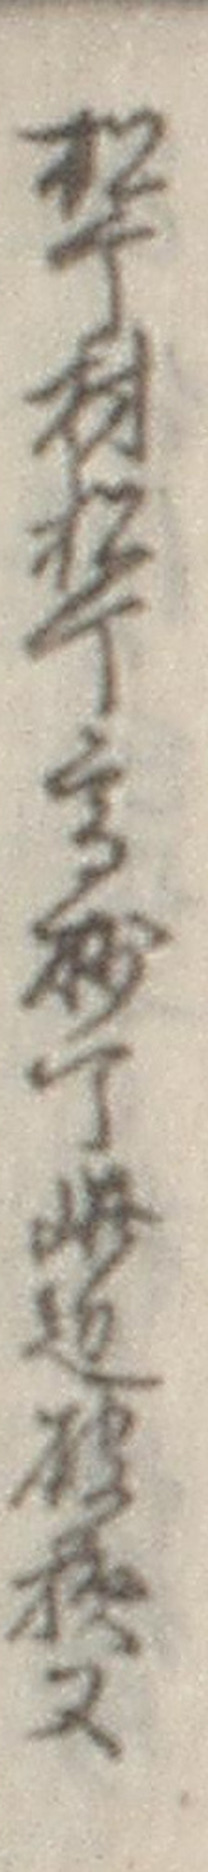松丁村松丁高砂丁此辺破損又
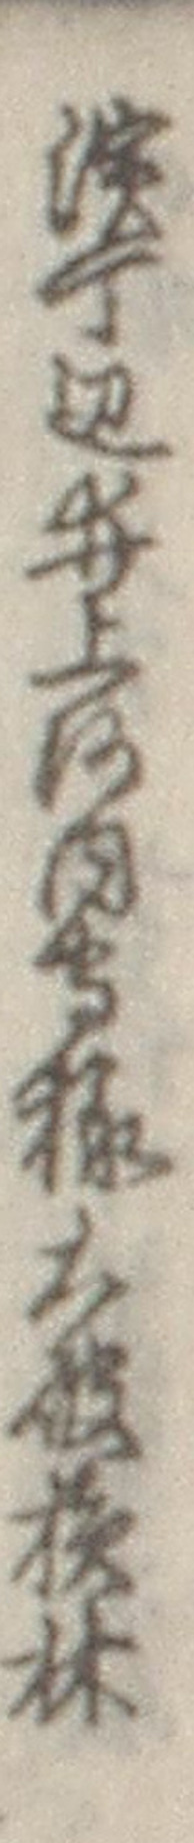濱丁辺井上河内守様大破損林
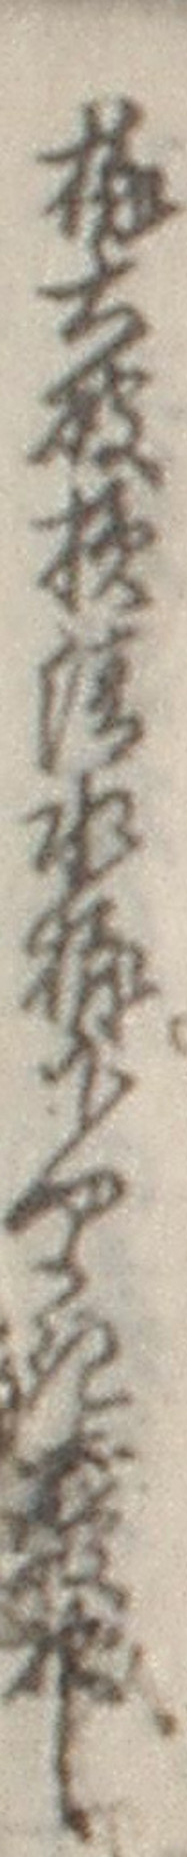様大破損清水様下やしき大破損
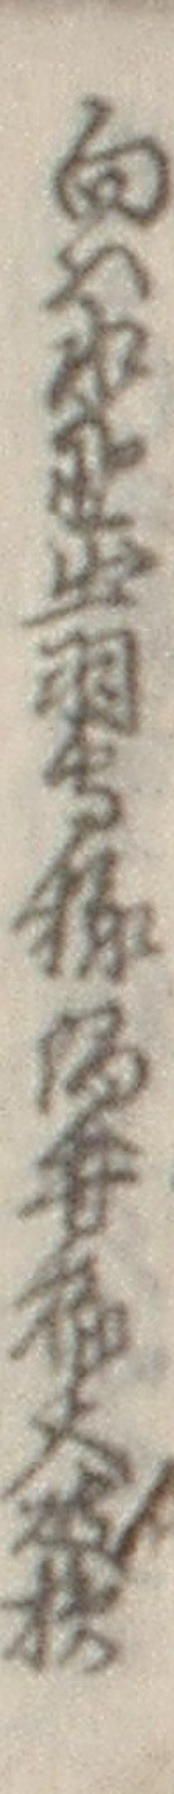向ハ水野出羽守様酒井様大破損
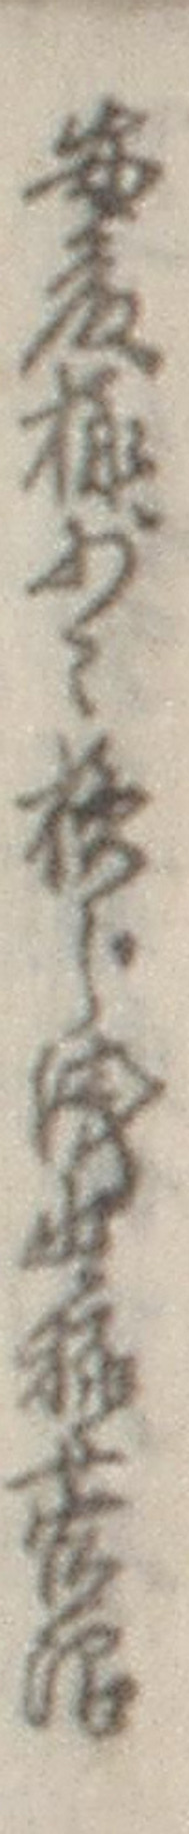安藤様少〻損じ浅野様菅沼
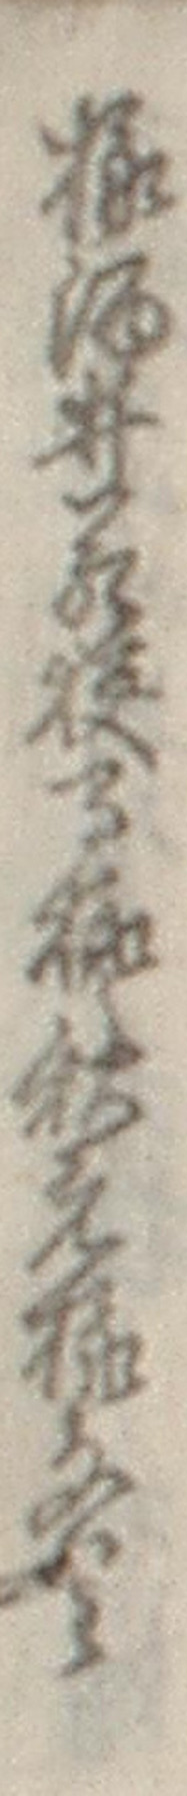様酒井若狭守様秋元様各〻
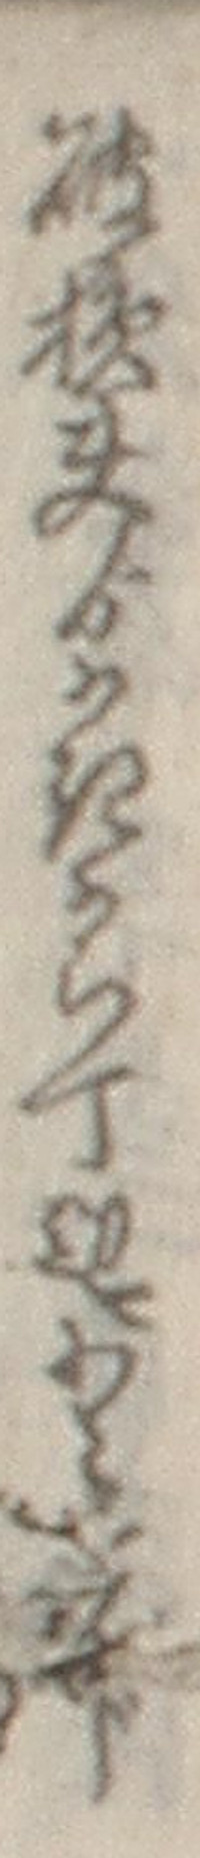破損夫ゟかきうら丁辺少〻損じ
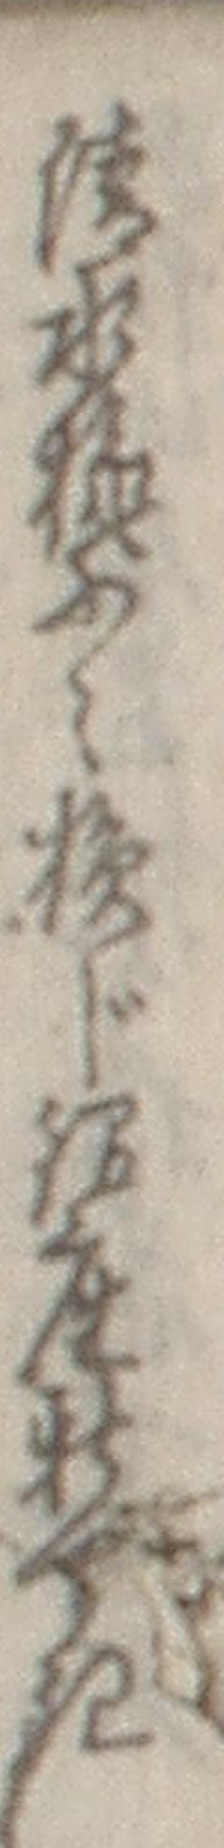清水様少〻損じ銀座新やしき
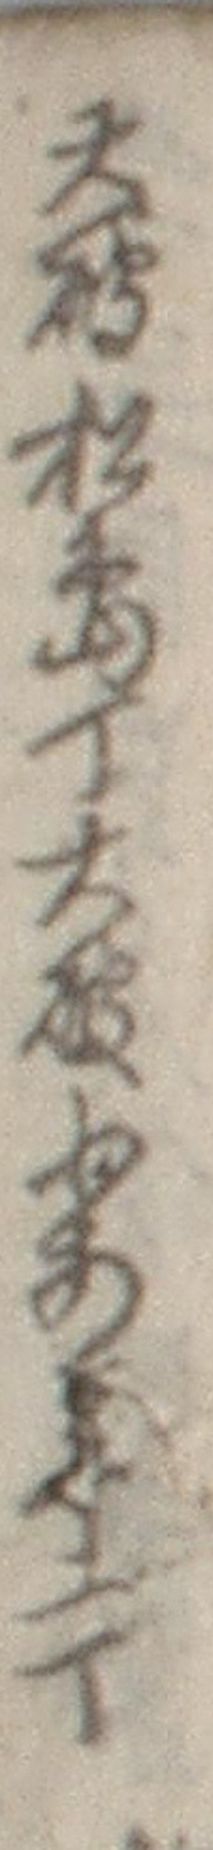大破松島丁大破小あ美一丁

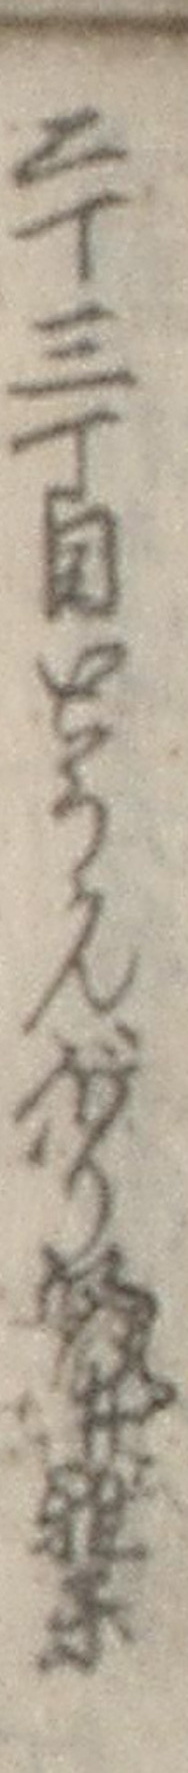二丁三丁目とうかんぼり酒井雅樂
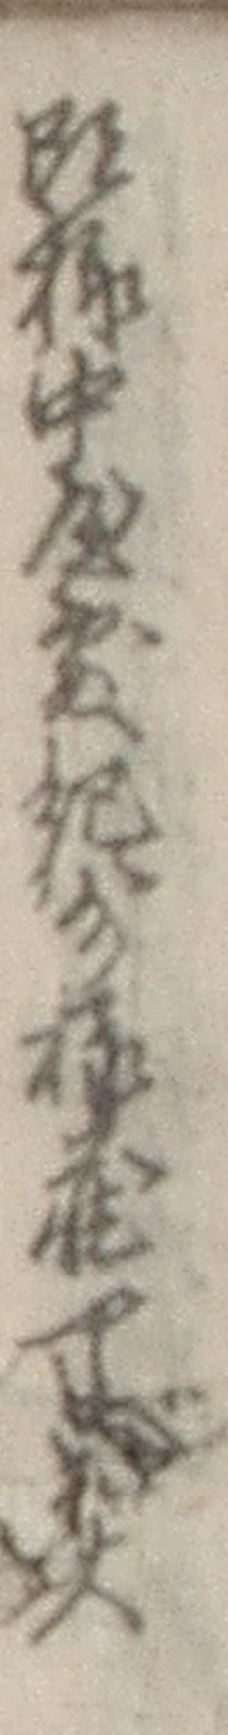頭様中屋敷紀州様蔵やき大
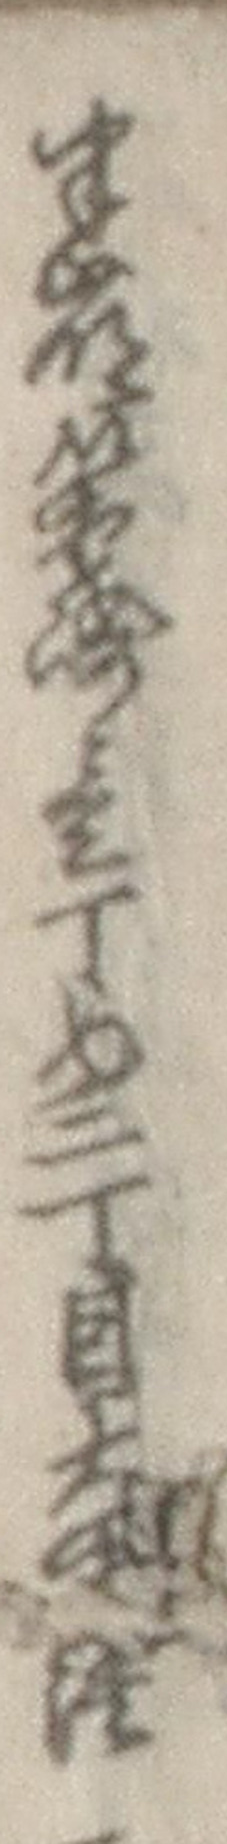半崩箱崎壱丁め弐丁目大半潰
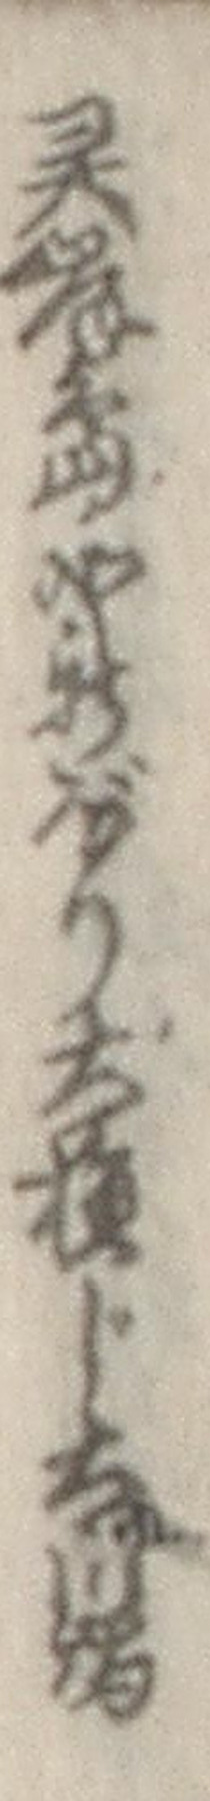霊岸島北新ぼり大損じ大川端
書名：江戸　大地震臣細録　全
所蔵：東京大学地震研究所図書室 Earthquake Research Institute Library, The University of Tokyo, JAPAN
